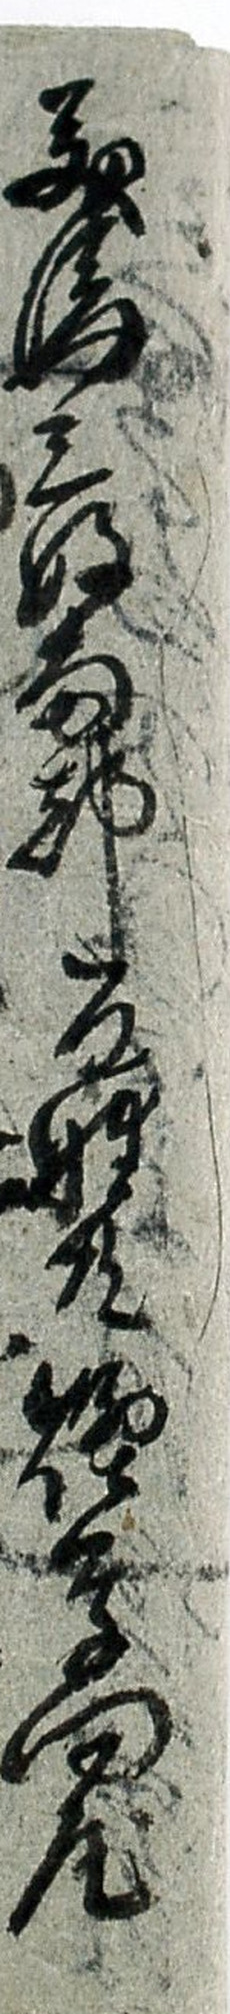美馬三好両郡百姓共煙草問屋
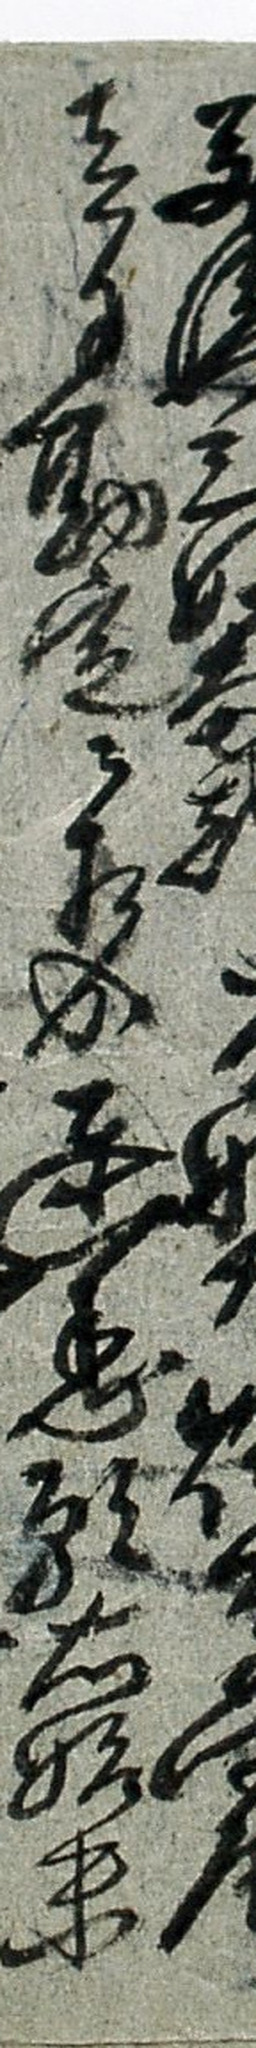壱手勘定に相成迷惑願右始末
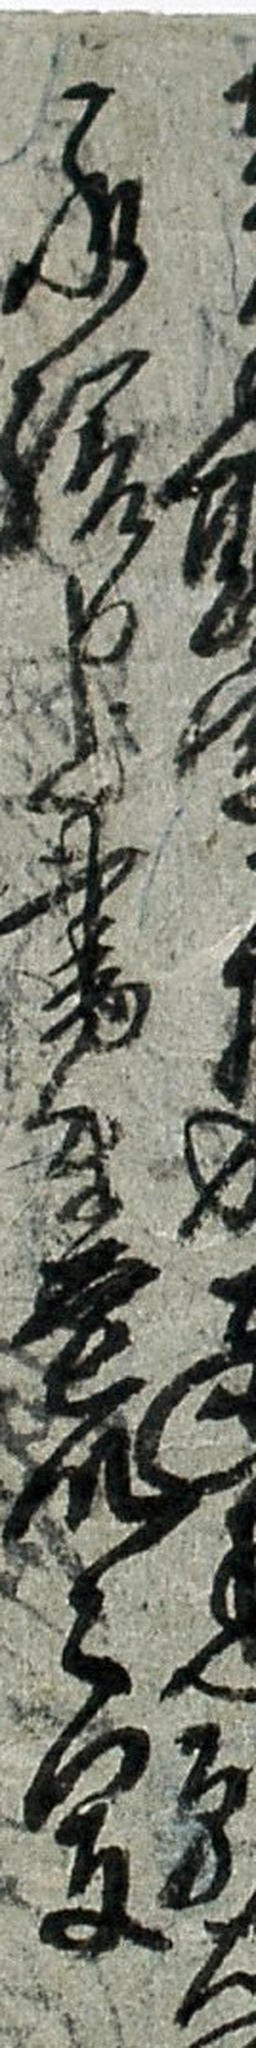承繕申上書付荒々写
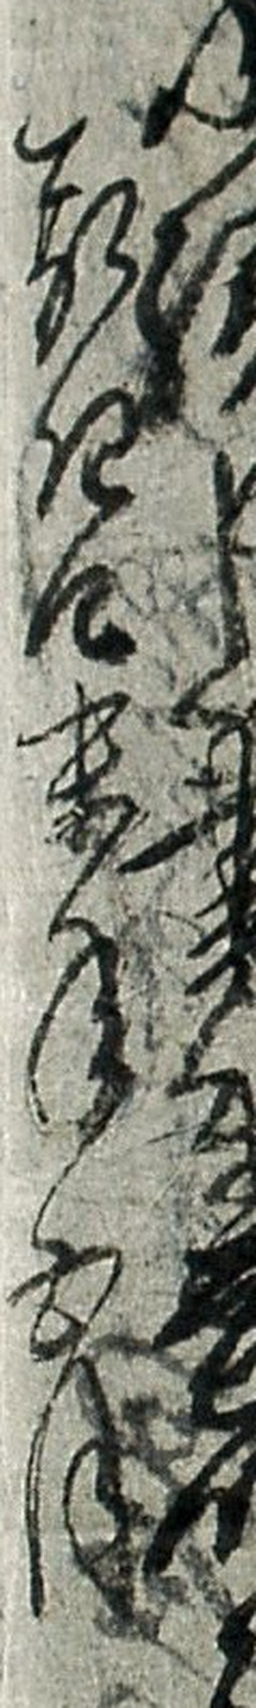弘化四未年五月

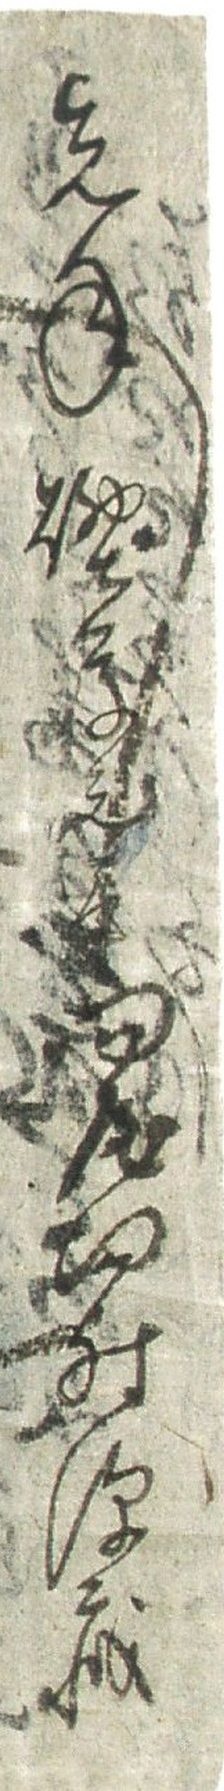先年煙草元取問屋田村源蔵
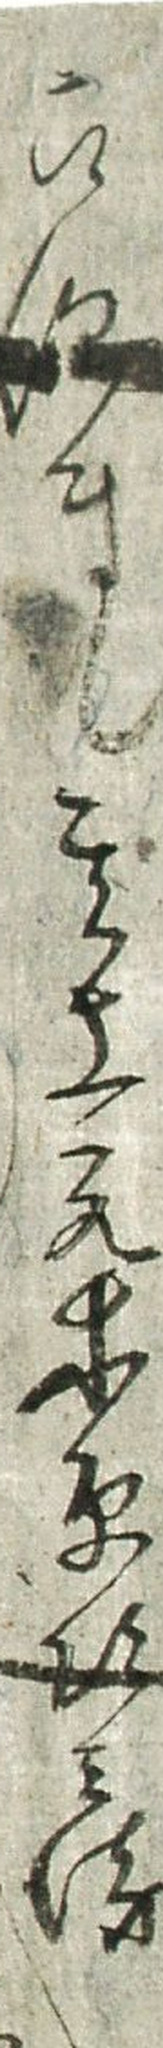被仰付候其上元木平次兵衛
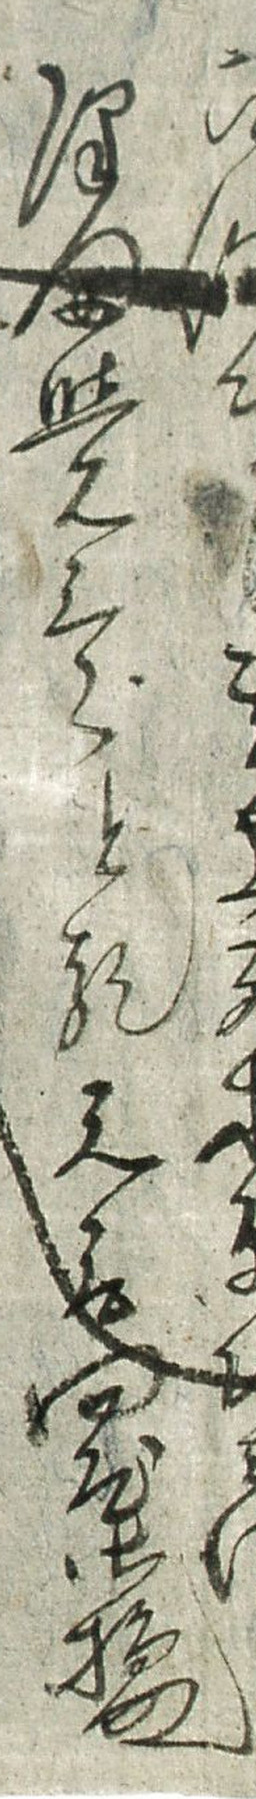沢田覚三郎とか元取問屋御指加へ
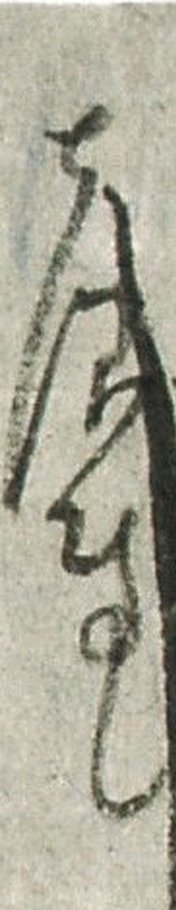被仰付候
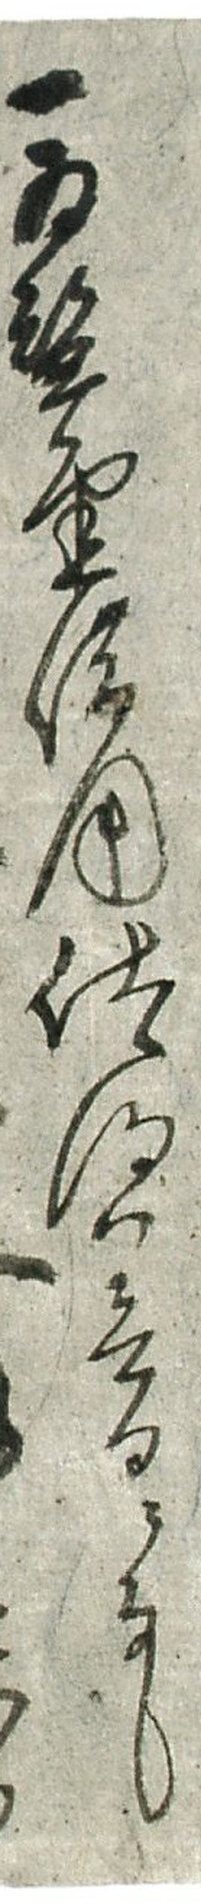一為替金借用仕候得は壱日にても
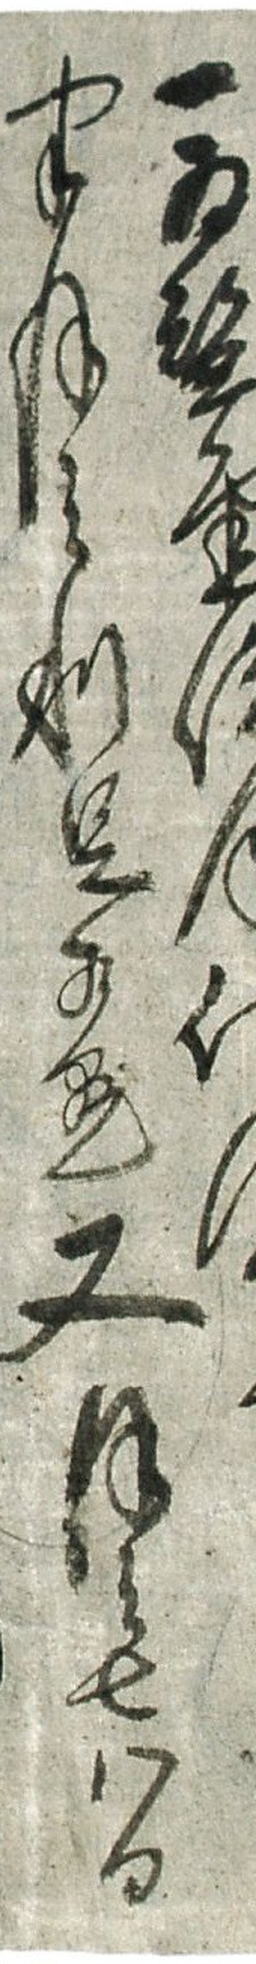半月之利足相懸又月之七八日
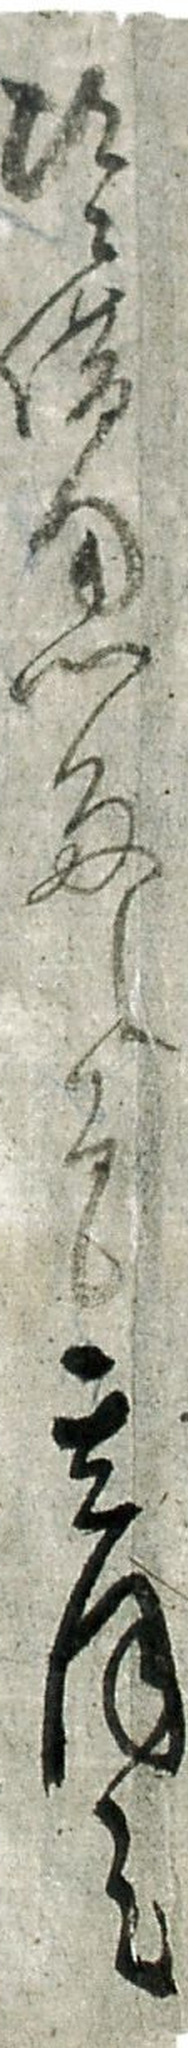頃に借用いたし候ても其月之
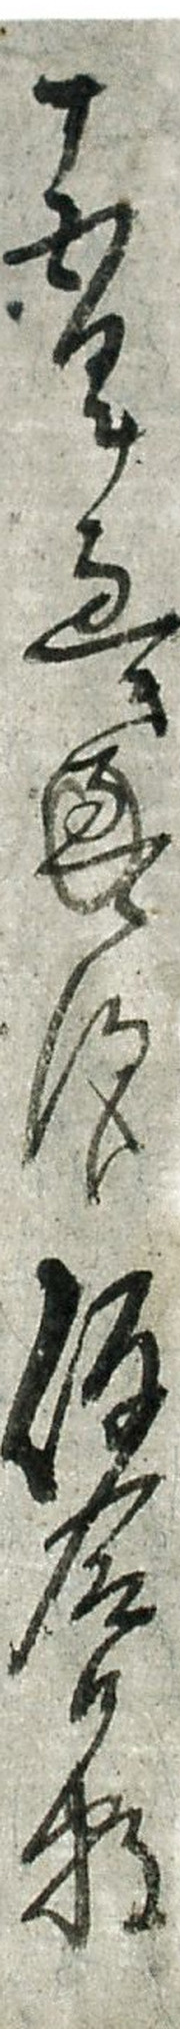十五日を過き候得は仮令日数
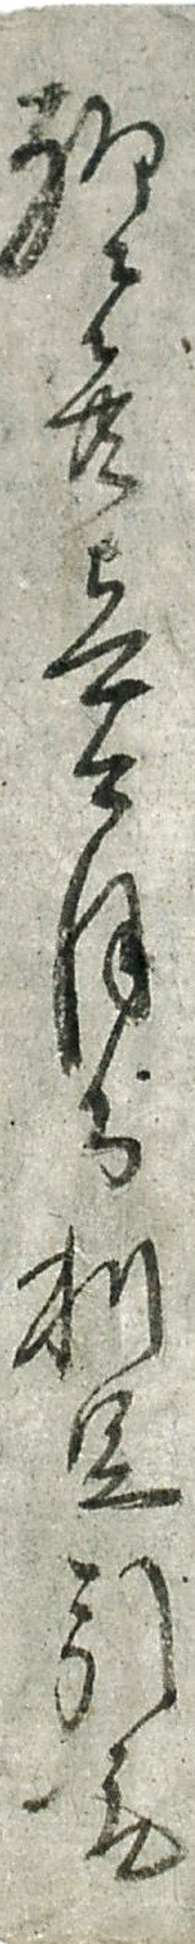聊に候共壱ヶ月分利足引取
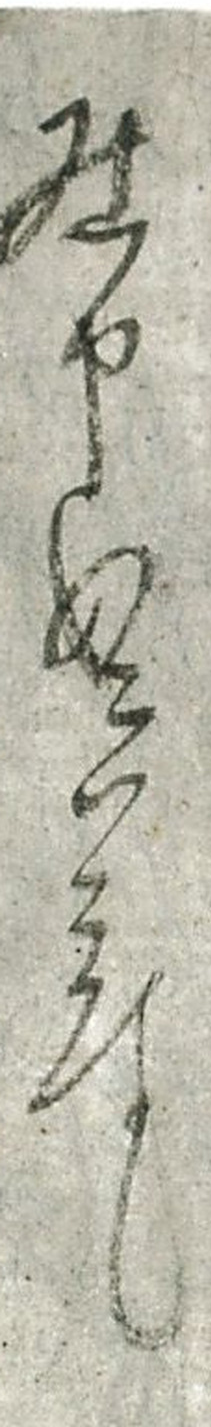居申義に御座候
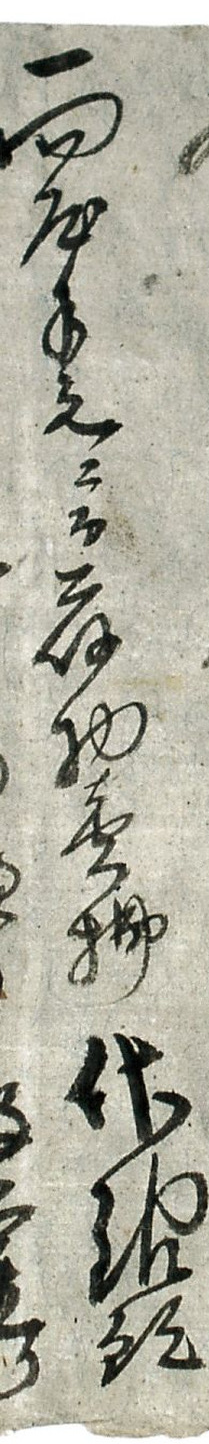一問屋手元にて荷物売払代銀預
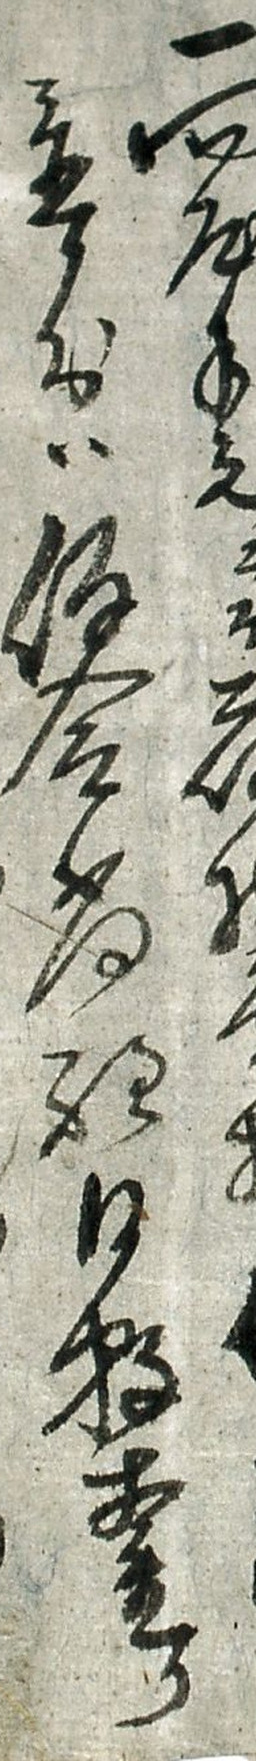置候分は仮令如何程日数相重り
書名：(美馬三好両郡百姓共煙草問屋壱手勘定ニ相成迷惑願右始末承申上書付之写）
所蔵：鳴門教育大学 Naruto University of Education
